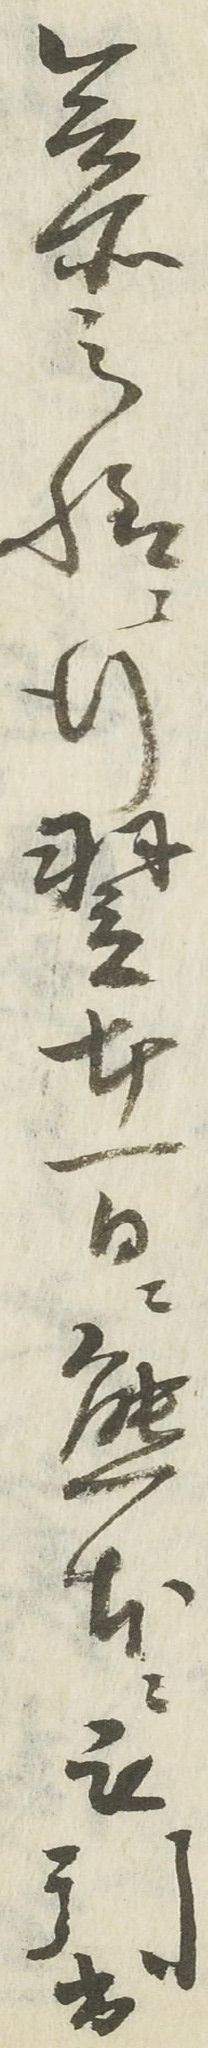会所之様ニ行翌廿一日ニ熊本ニ被引出
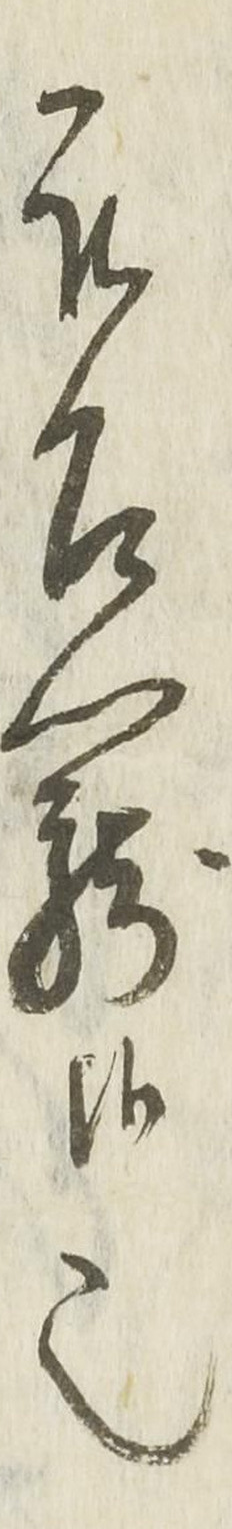被召籠候也
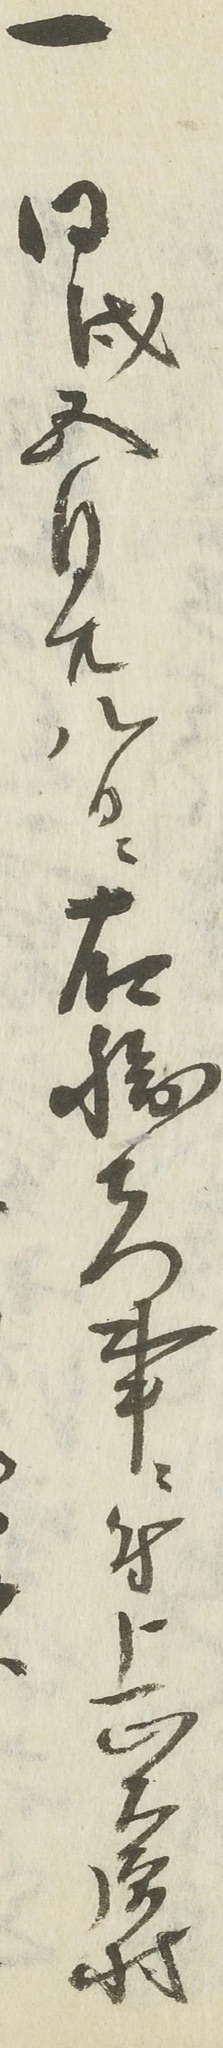一同戌五月廿八日ニ右勝右衛門事ニ付上岩原村
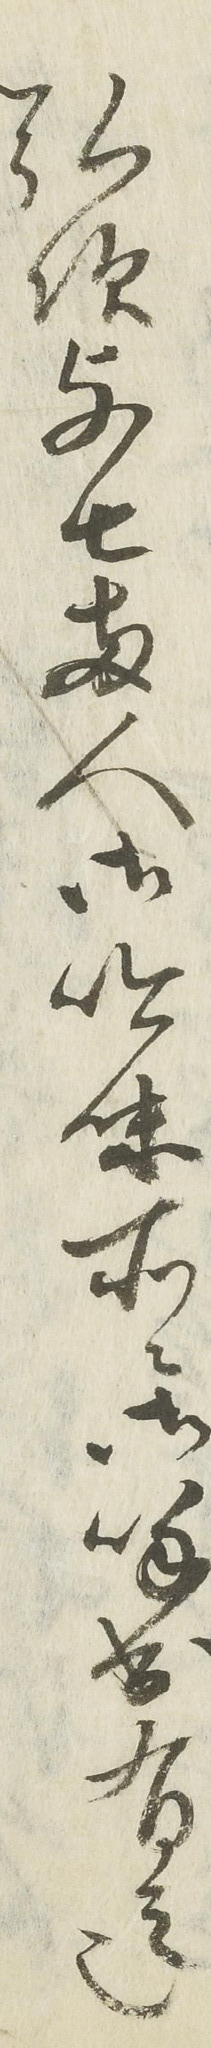弘次与七両人御吟味所ニ御呼出有之也
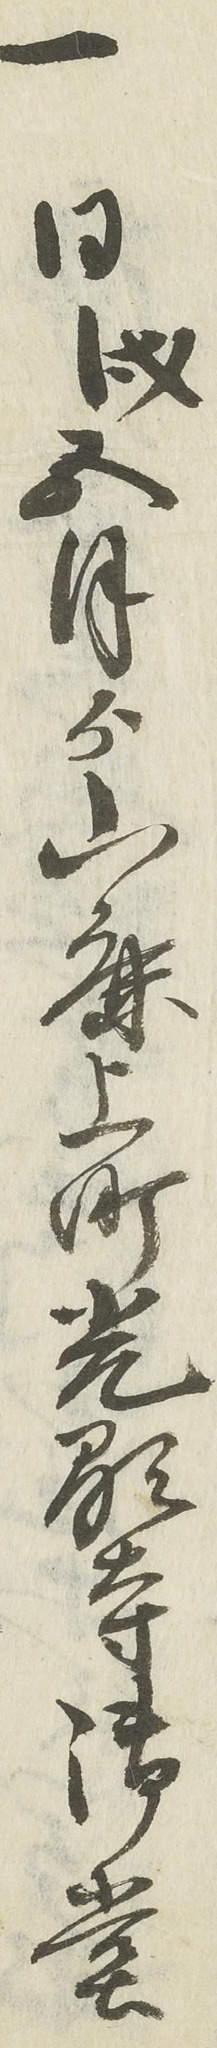一同戌五月ゟ山鹿上町光顕寺御堂
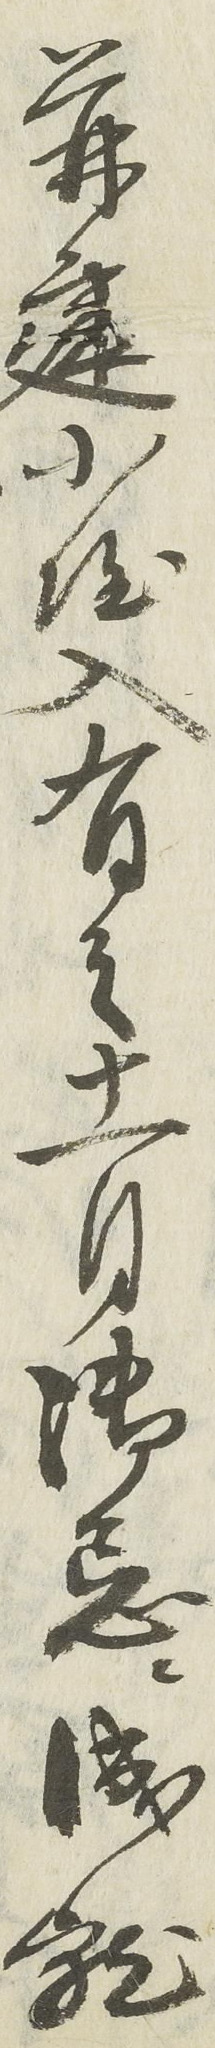幷建小屋入有之十一月御忌ニ成就
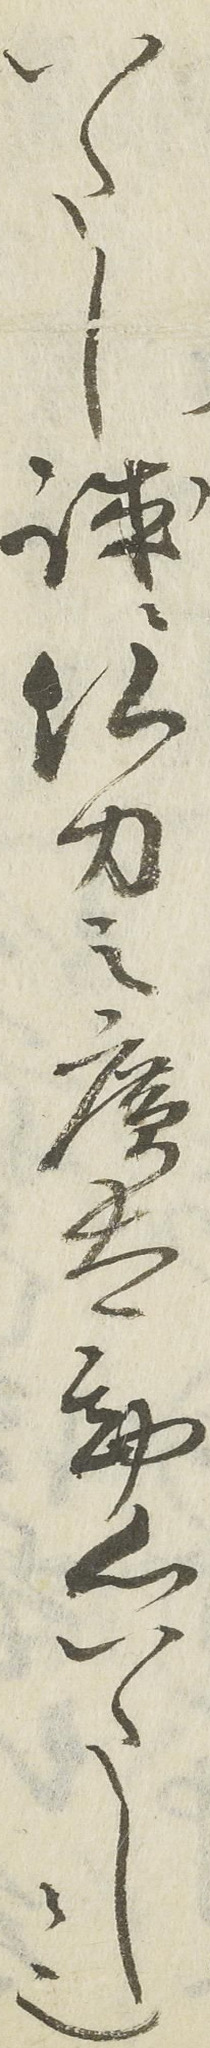いたし誠ニ仏力之廣太勘心いたし候也
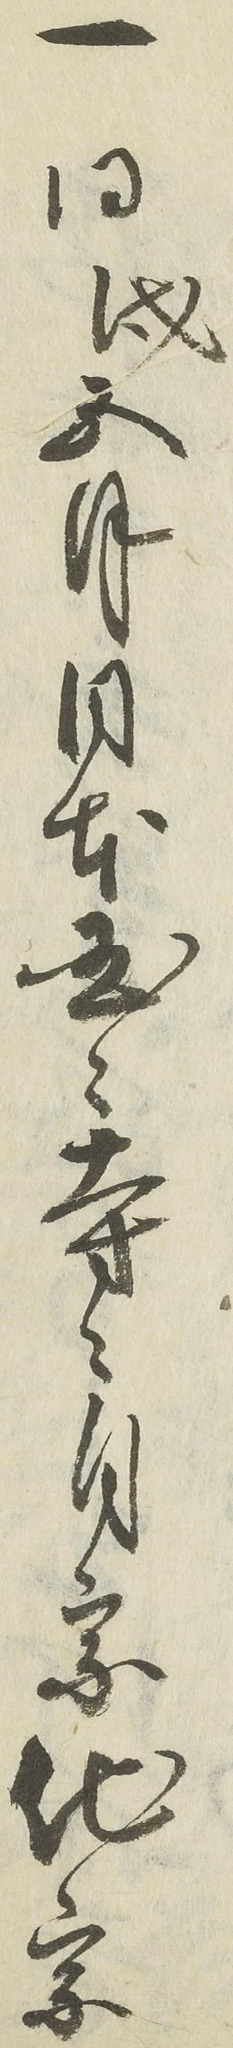一同戌五月日本国の寺〻自宗他宗

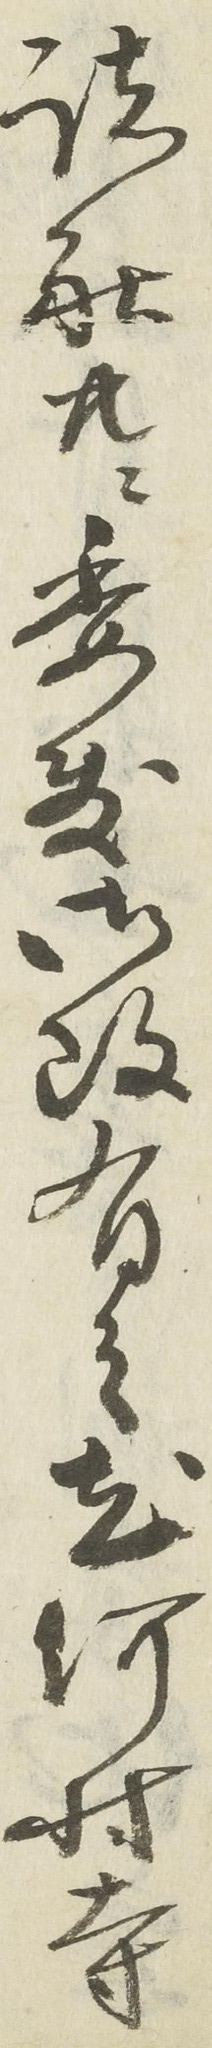諸社共ニ委敷御改有之尤何村寺
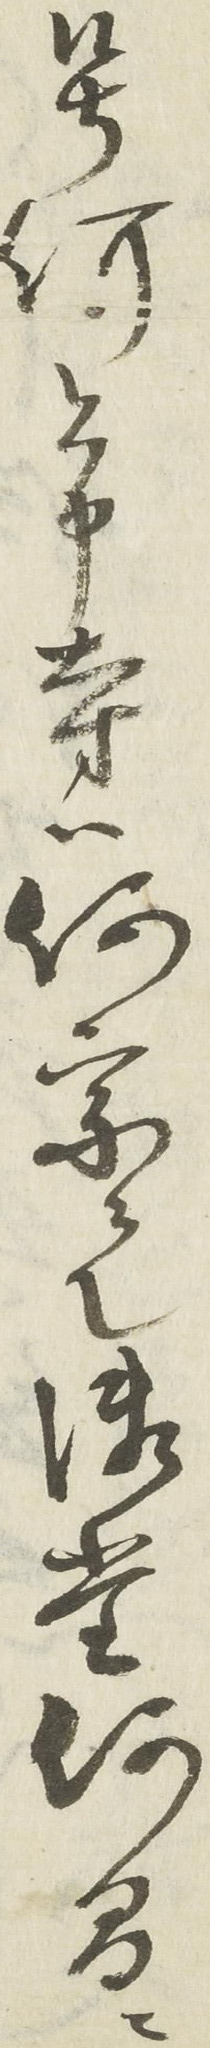号何と申寺は何宗ニて御堂何間ニ
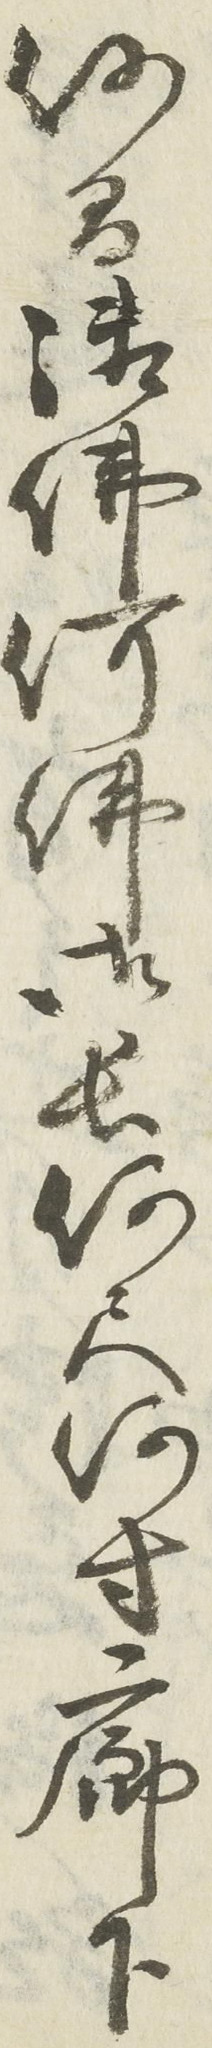何間御佛何佛御長何尺何寸廊下
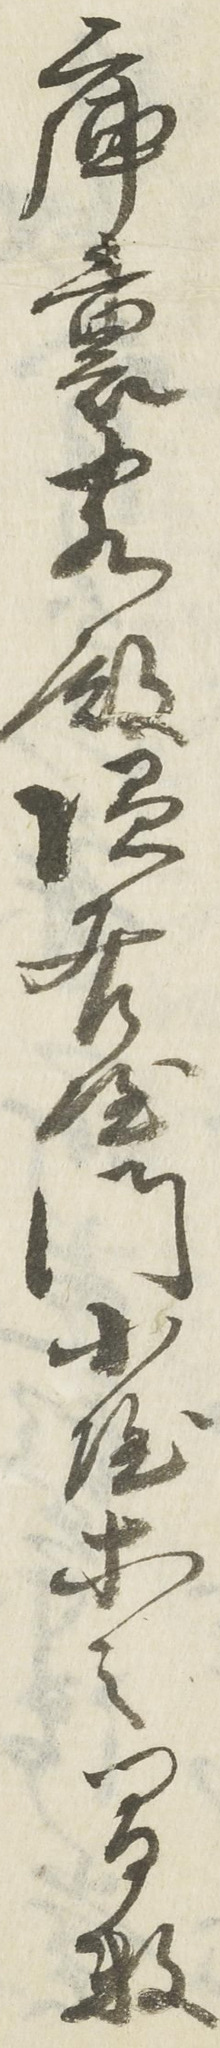庫裏客殿隠居屋門小屋等之間数
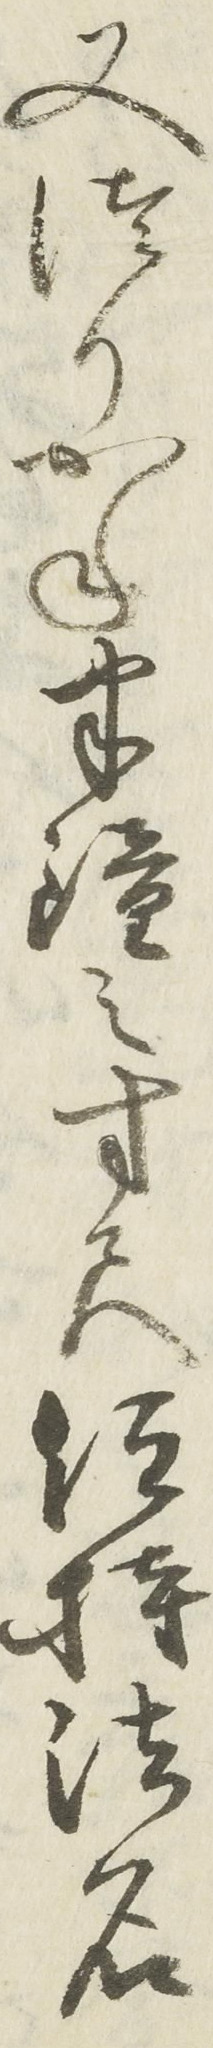又つりかね半鐘之寸尺住持法名
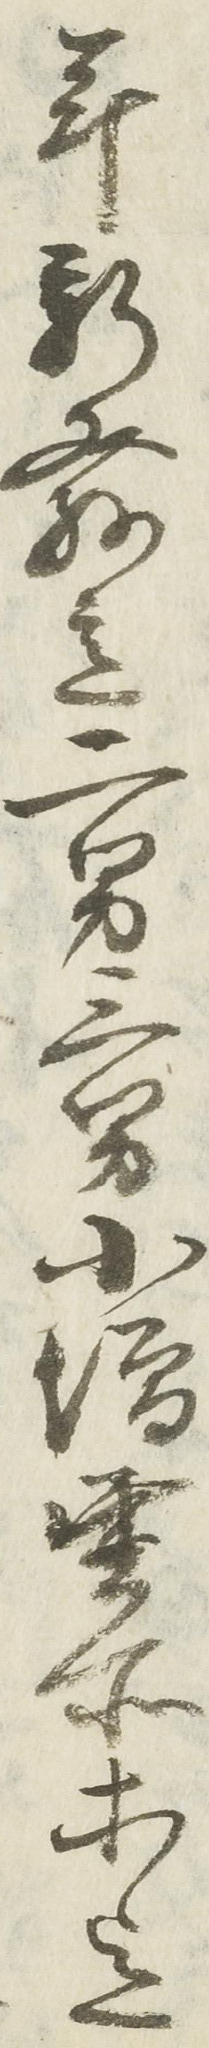年新発意二男三男小僧坐所等迄
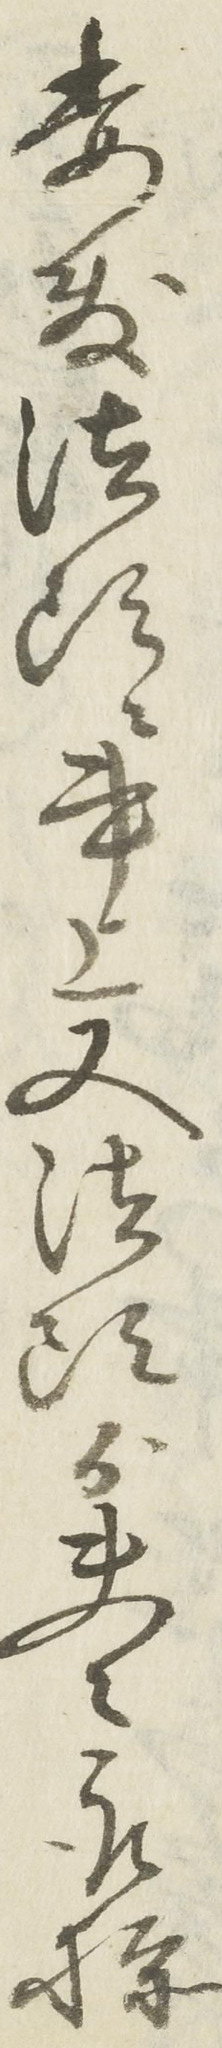委敷法頭ニ書上又法頭ゟ夫〻取纒
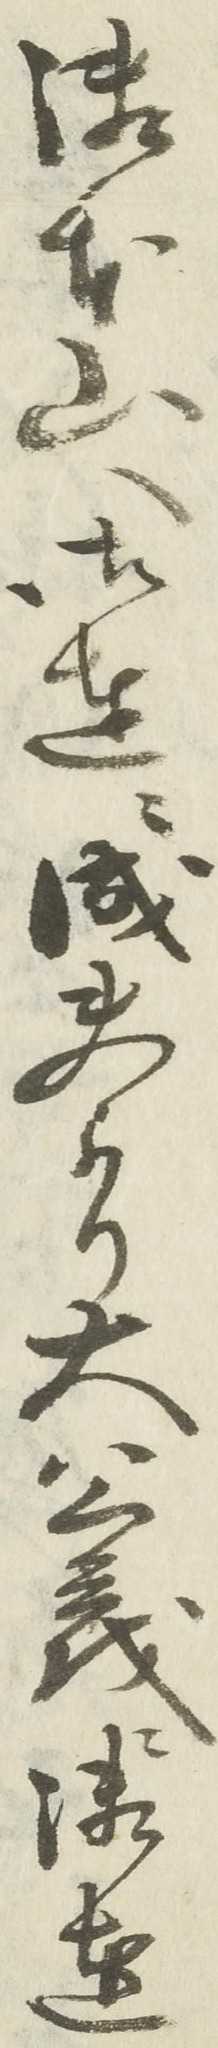御本山ヘ御達ニ成夫より大公義ニ御達
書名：後見笑
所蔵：東京大学地震研究所図書室 Earthquake Research Institute Library, The University of Tokyo, JAPAN
